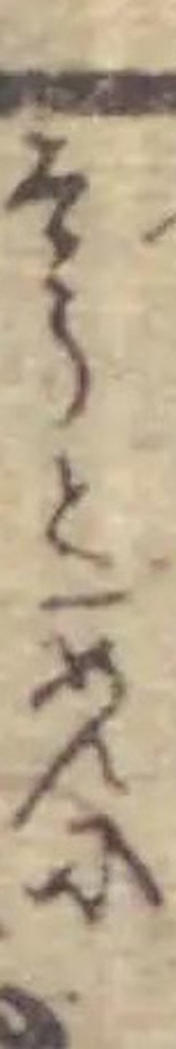そこら一めんに
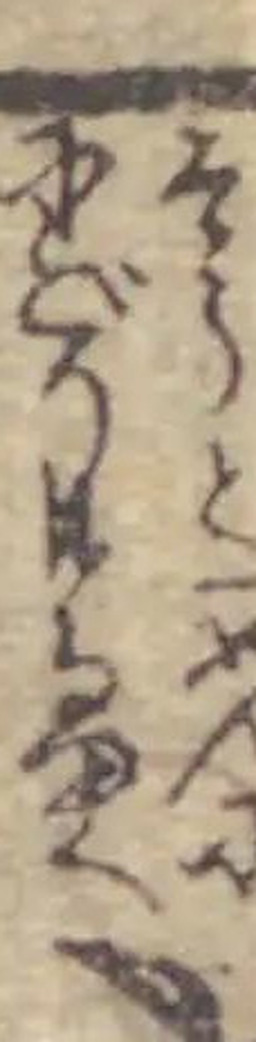にごりけるゆへ
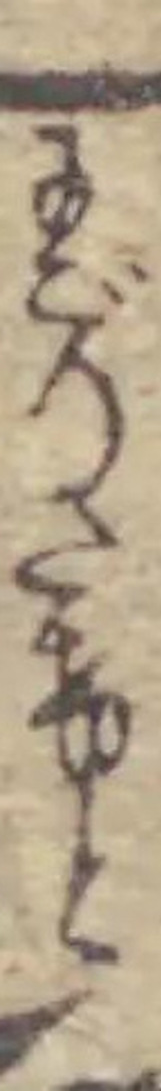にごりさけと
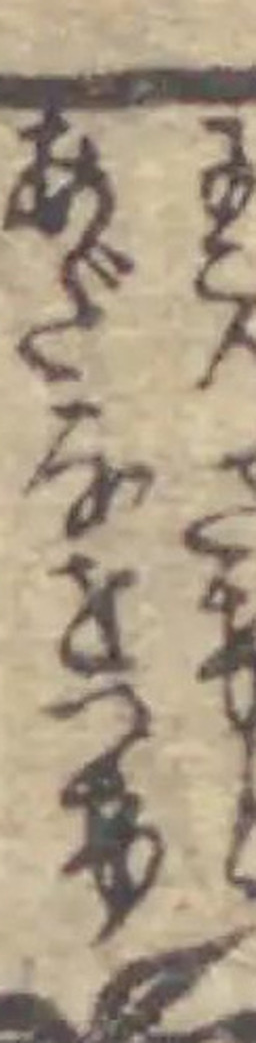あだなをつけ
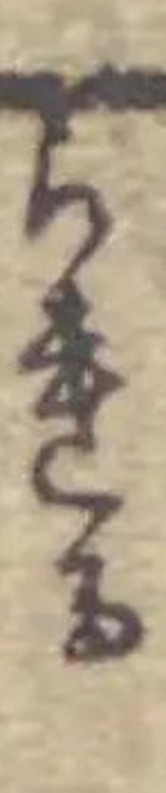られる
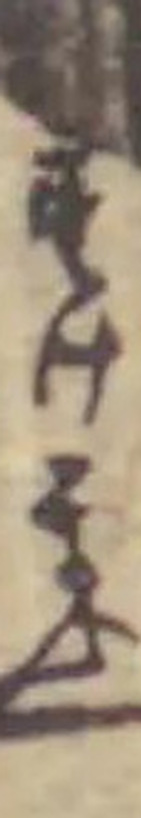すけそふ
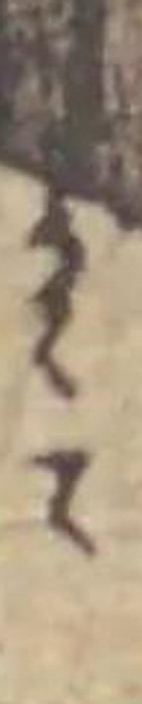かくて
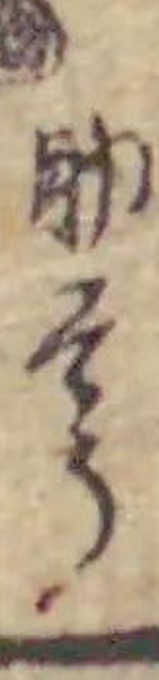助そう
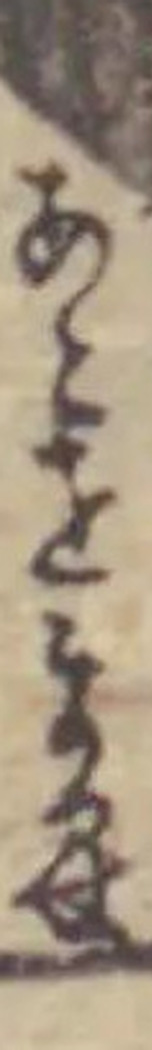あとをまかせ
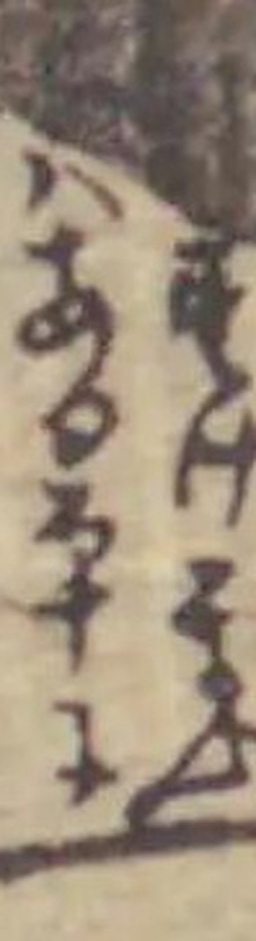はある平に
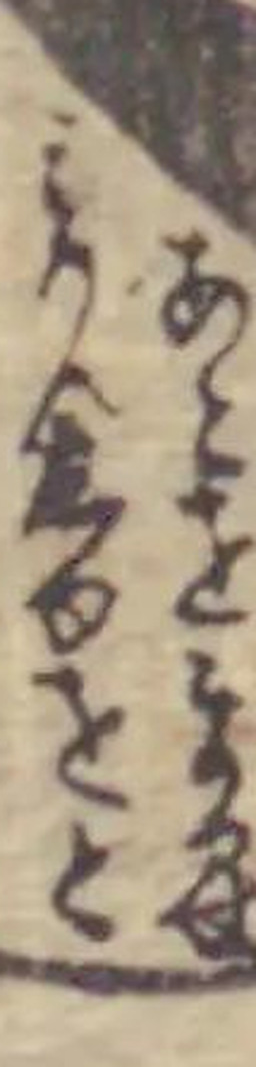みりんしゆをと
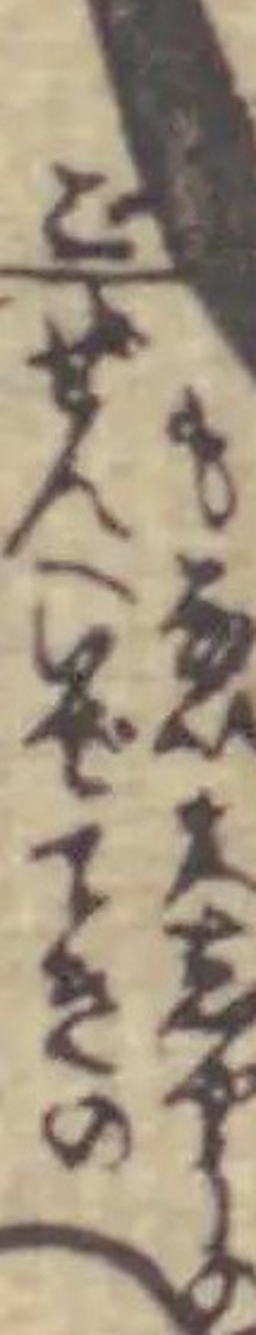ごぜんへいでてきの
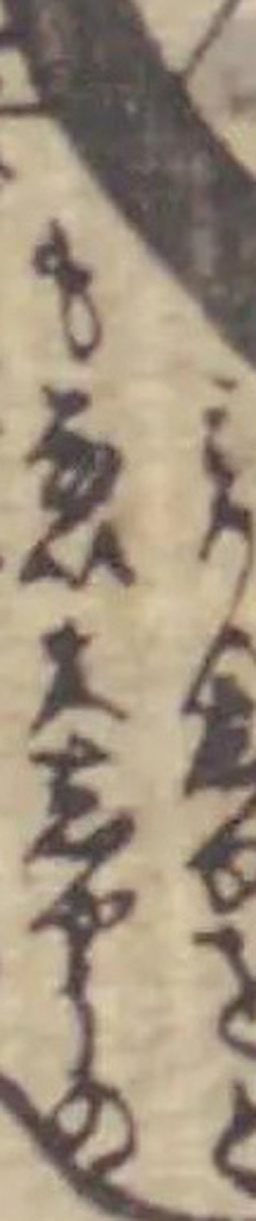もない大しやうの
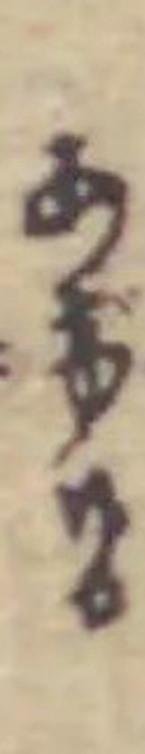あげける
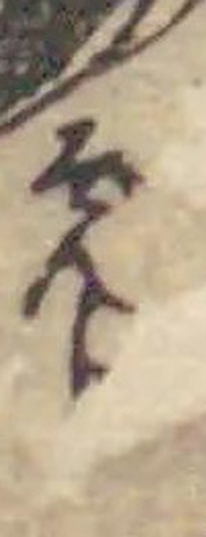ぞんじ
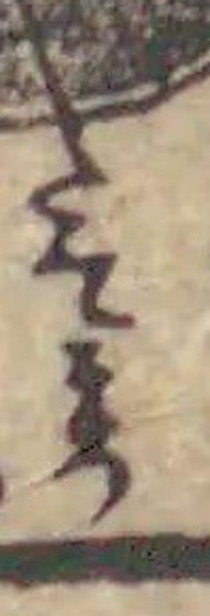たてまつり
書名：餅酒腹中能同志 2巻
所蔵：国立国会図書館 National Diet Library, JAPAN
